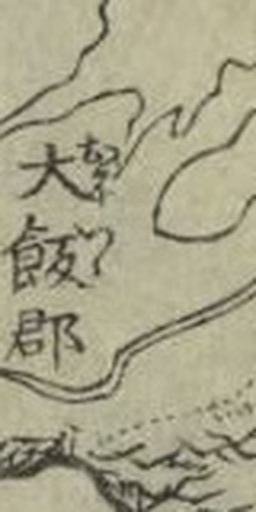大野郡

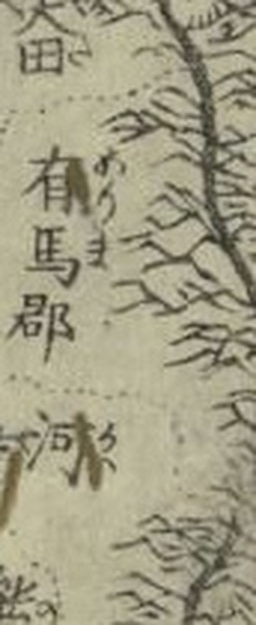有馬郡
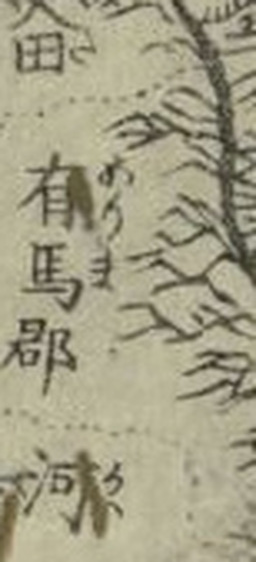有馬郡
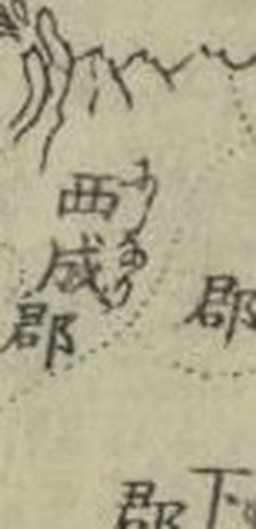西成郡

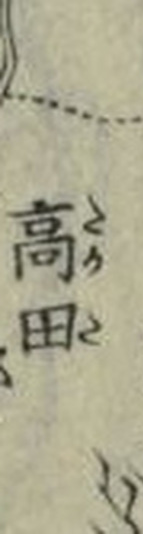高田郡
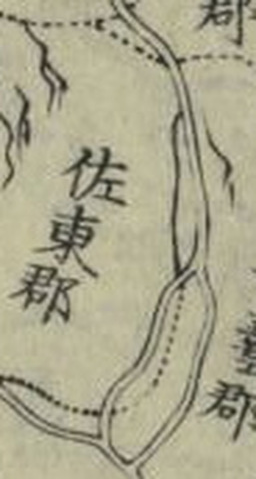佐東郡
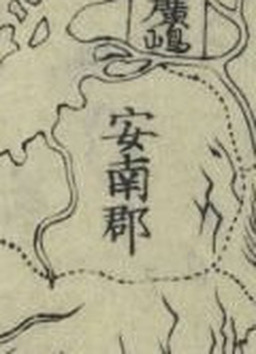安南郡

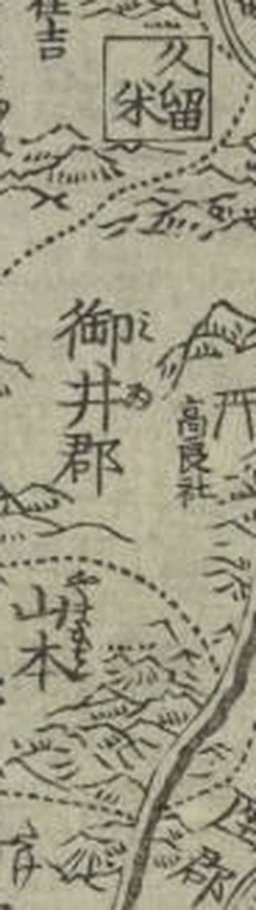御原郡
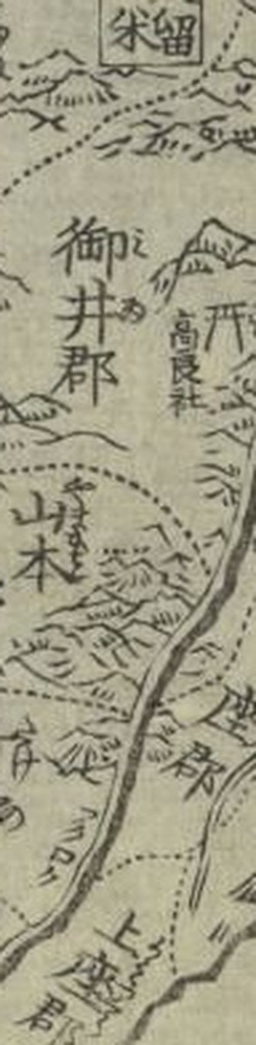御原郡
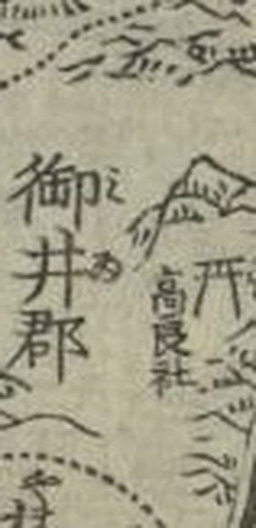御原郡
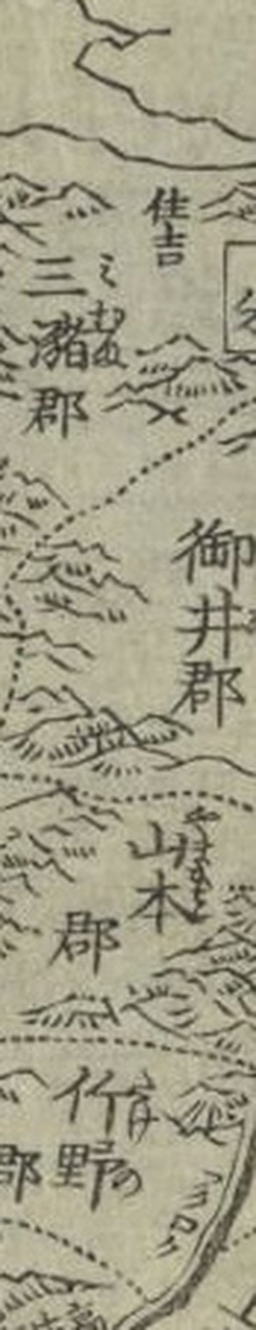三瀦郡
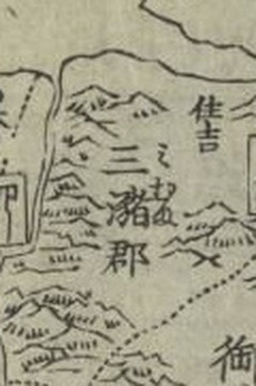三瀦郡
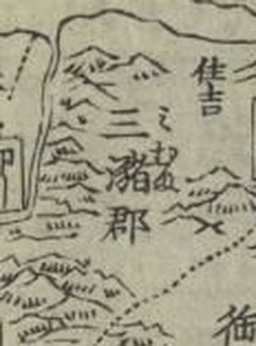三瀦郡
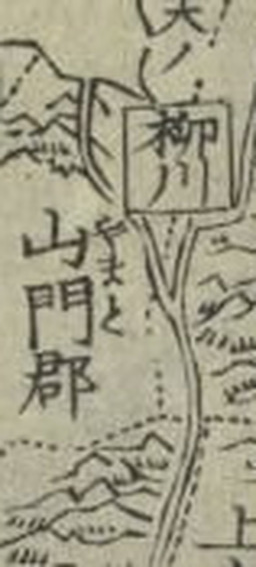山鹿郡
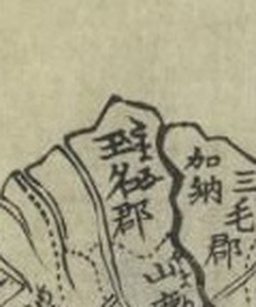玉名郡
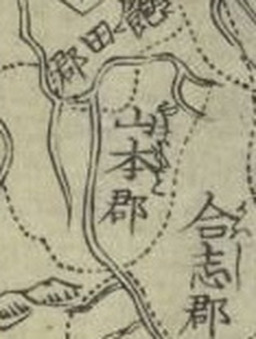山鹿郡
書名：大日本分境図成
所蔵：University of the Ryukyus Library
